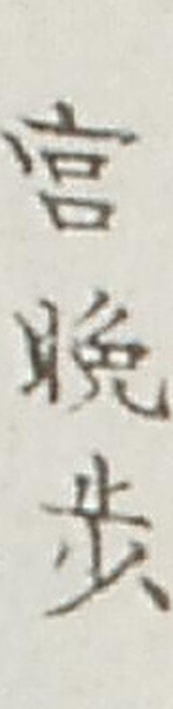宮晩歩
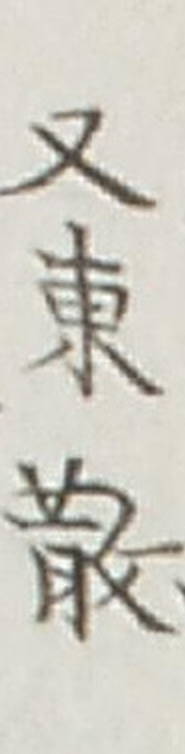又東散
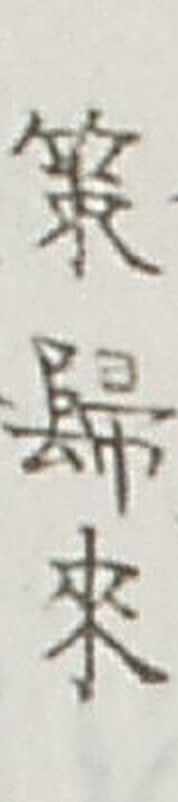策歸来
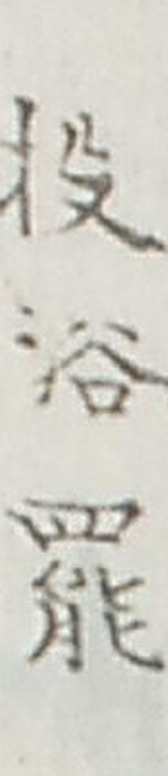投浴罷
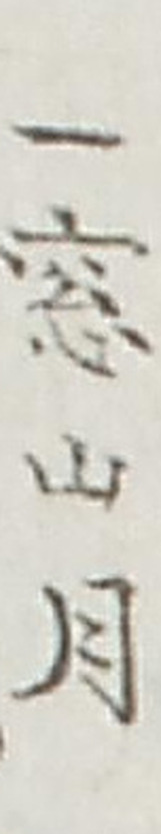一窓山月
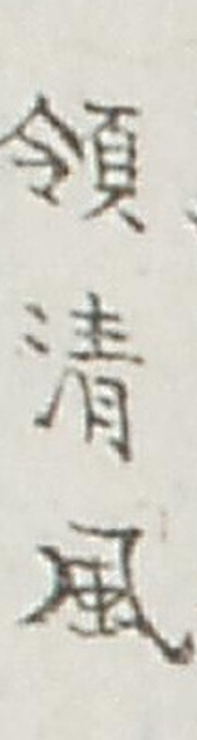領清風
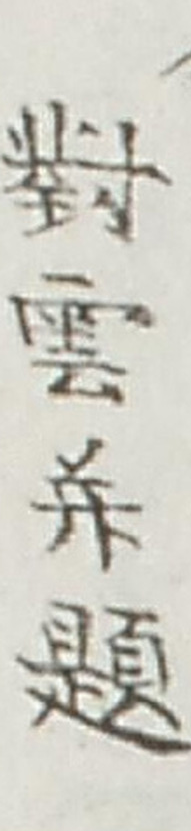對雲并題

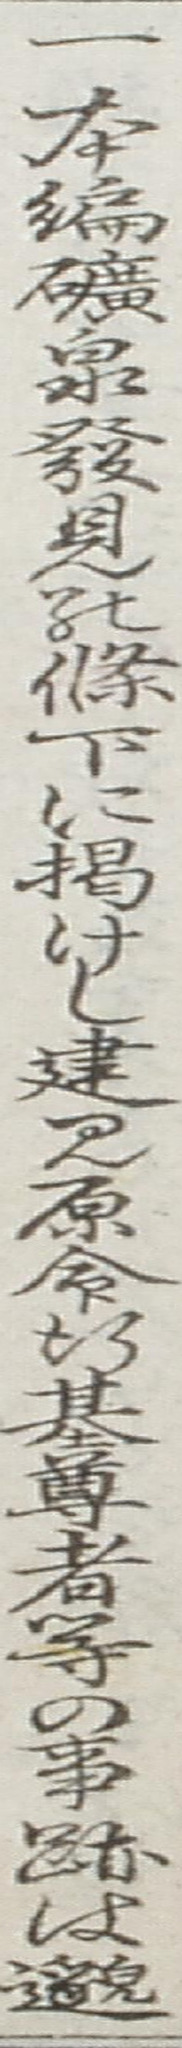一本編礦泉発見の條下に掲けし建見原命行基尊者等の事跡は邈
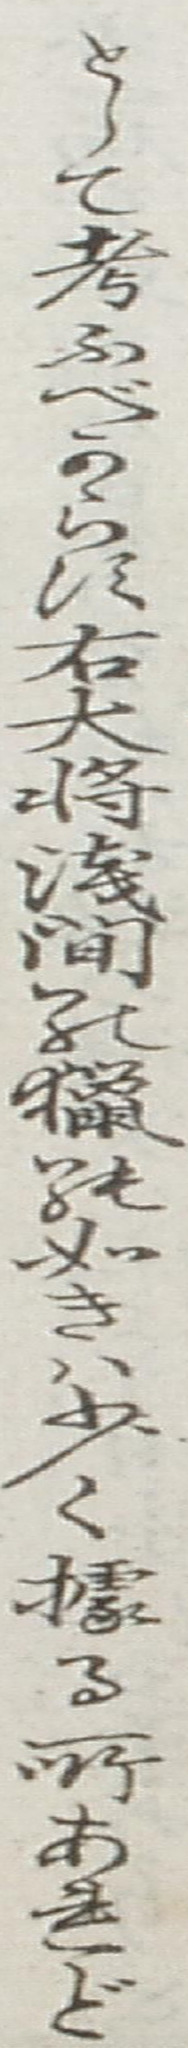として考ふべからす右大将浅間の猟の如きは少く據る所あれど
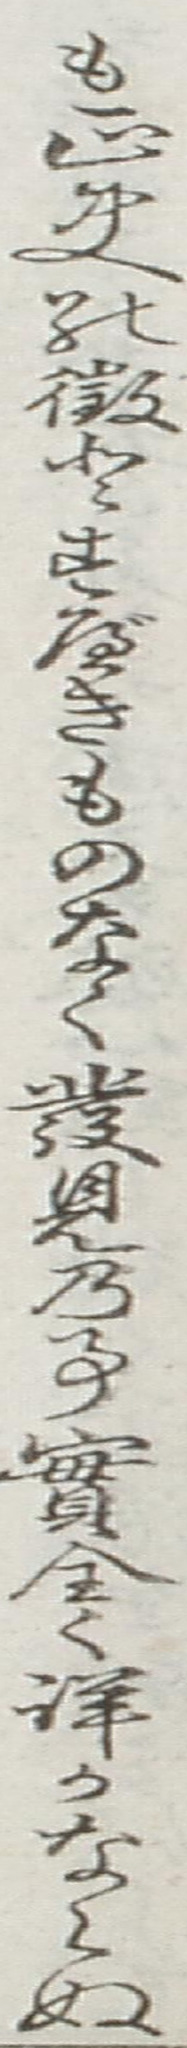も正史の徴はすべきものなく發見の事實全く詳かならぬ
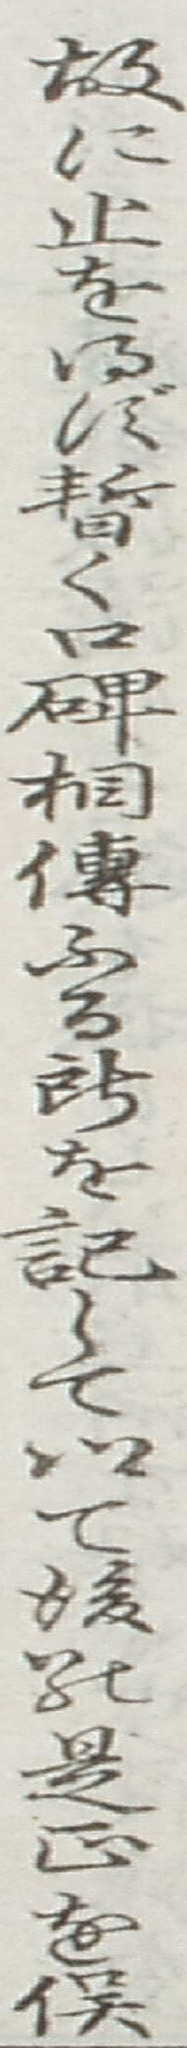故に止をえず暫く口碑相傳ふる所を記して以て後の是正を俣
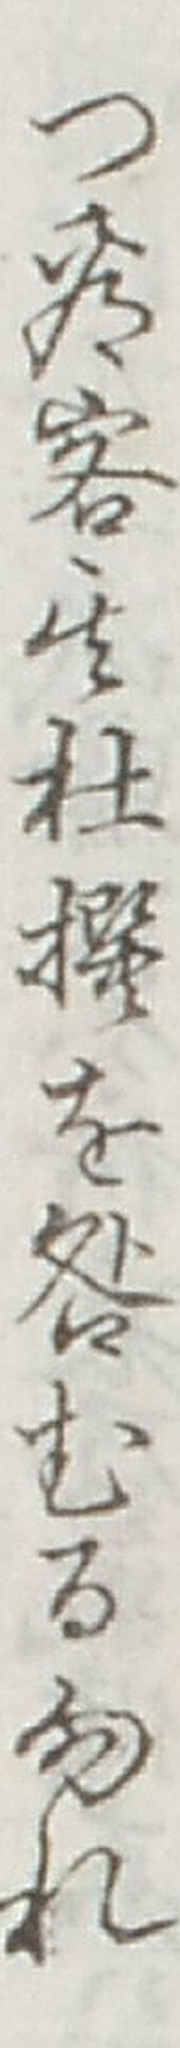つ爲客其杜撰を咎むる勿れ
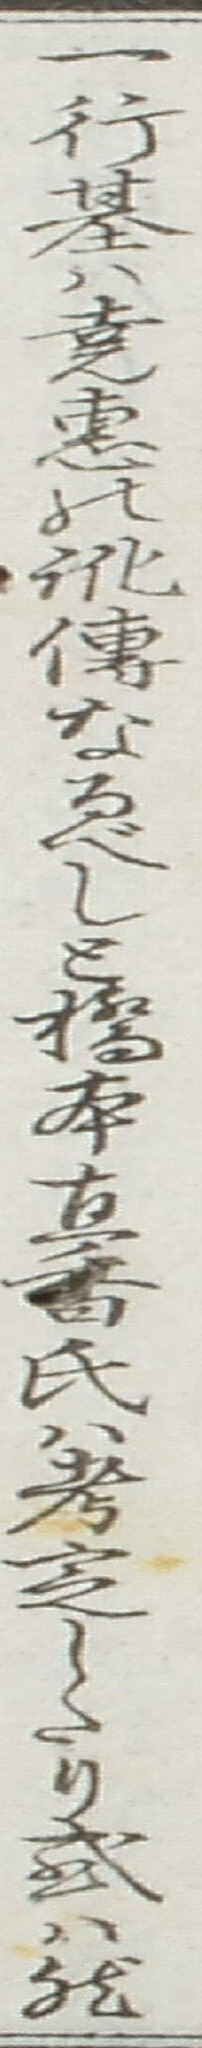一行基は尭恵の仳傳なるべしと橋本真香氏は考察したり或は然
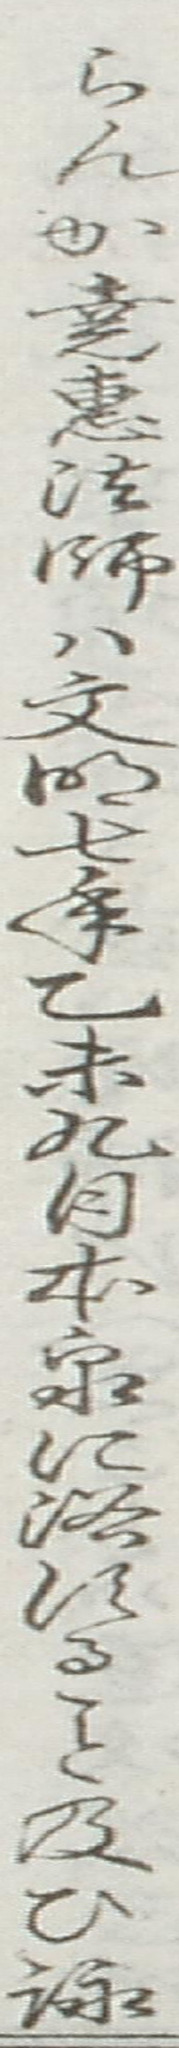らんか尭恵法師は文明七年乙未九月本泉に浴すること及ひ詠
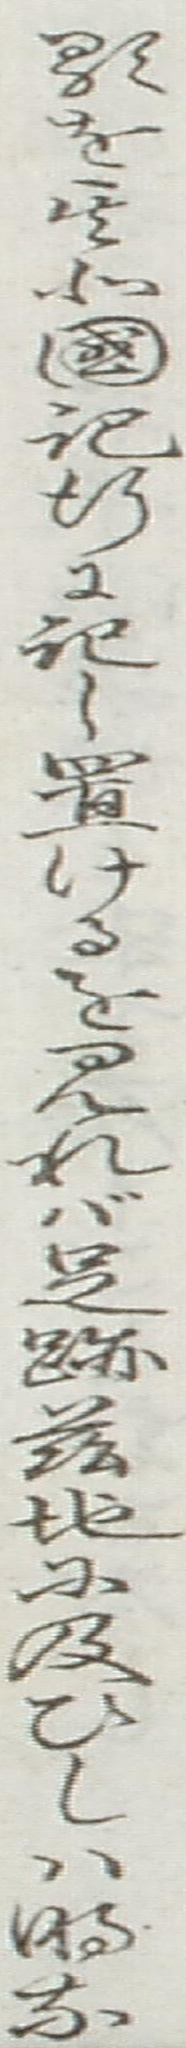歌を其北國記行に記し置けるを見れば足跡茲地に及ひしは明な
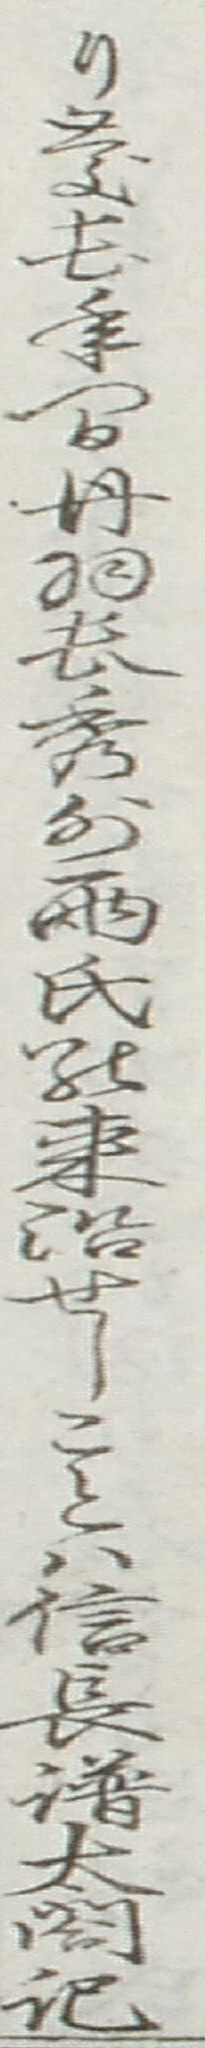り慶長年間丹羽長秀公両氏の来浴せしことは信長譜太閤記
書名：草津温泉誌　全
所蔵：東京大学地震研究所図書室 Earthquake Research Institute Library, The University of Tokyo, JAPAN
